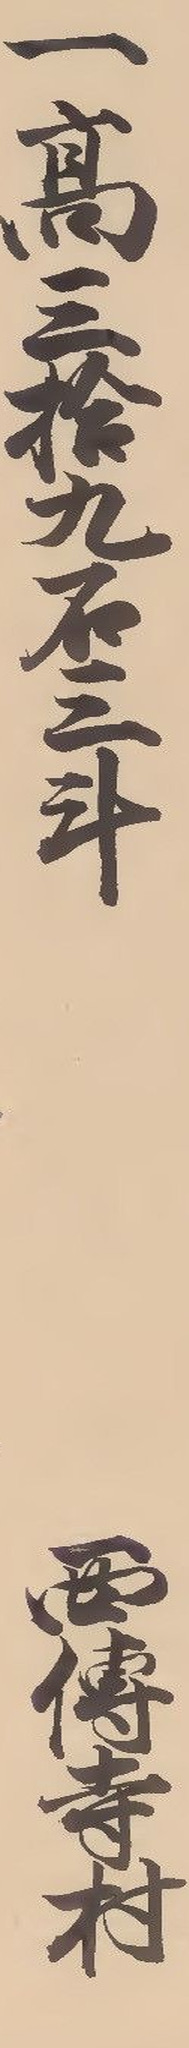一高三拾九石三斗西伝寺村

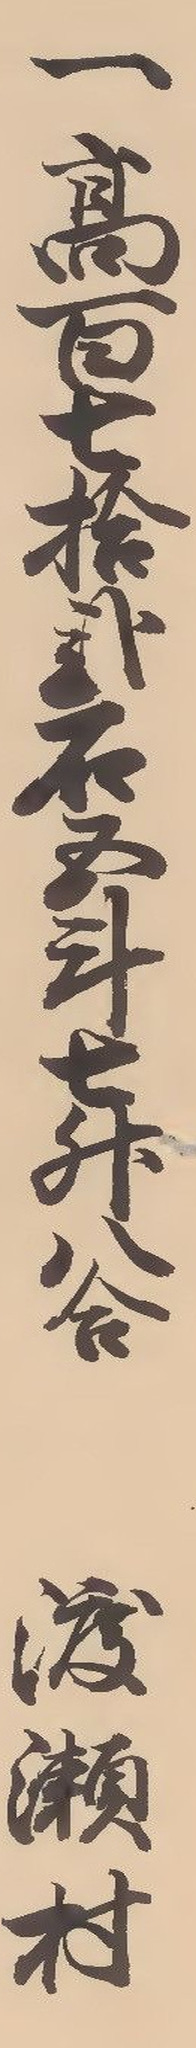一高百七拾弐石五斗七升八合渡瀬村
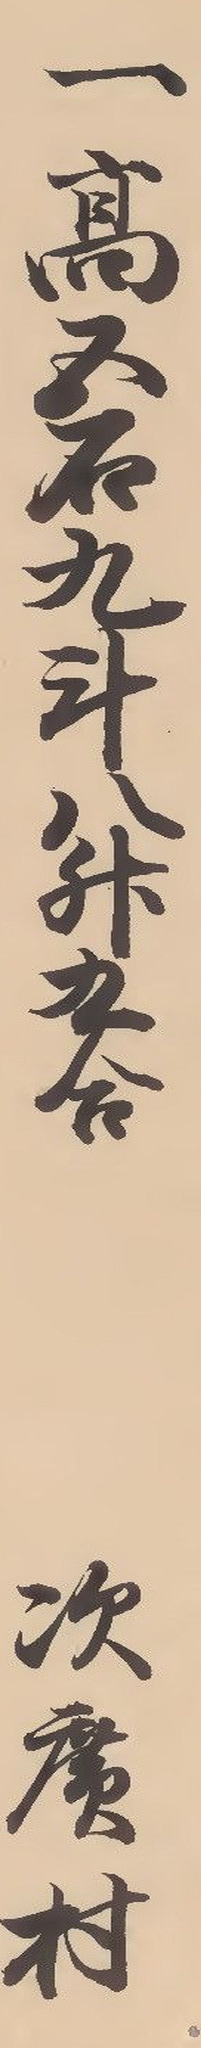一高五石九斗八升九合次広村
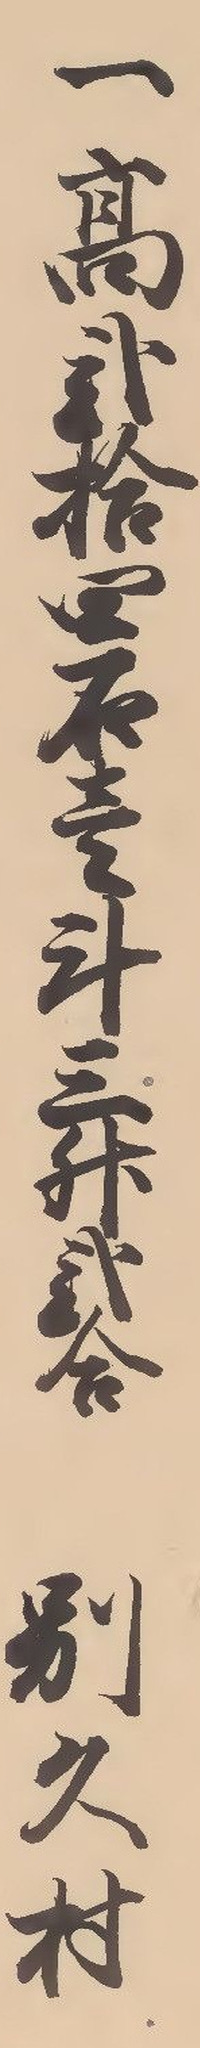一高弐拾四石壱斗三升弐合別久村
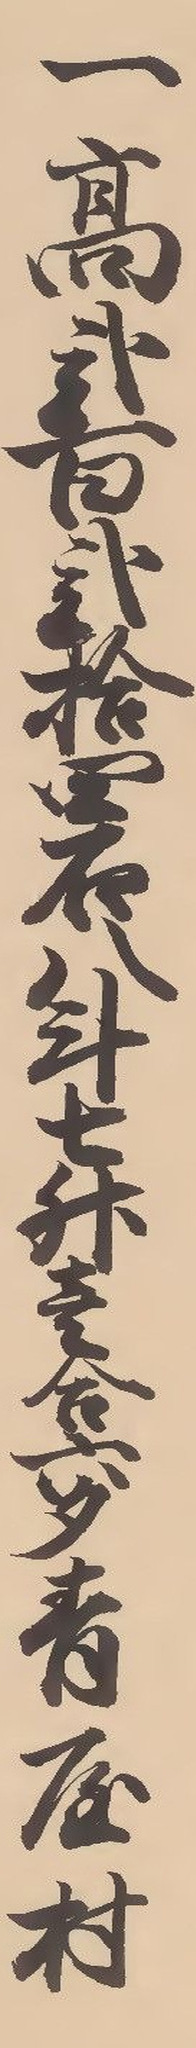一高弐百弐拾四石八斗七升壱合六勺青屋村
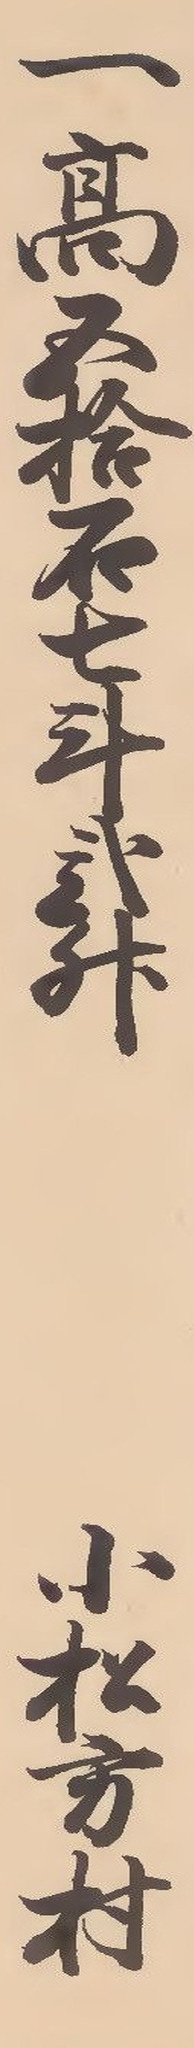一高五拾石七斗弐升小松方村
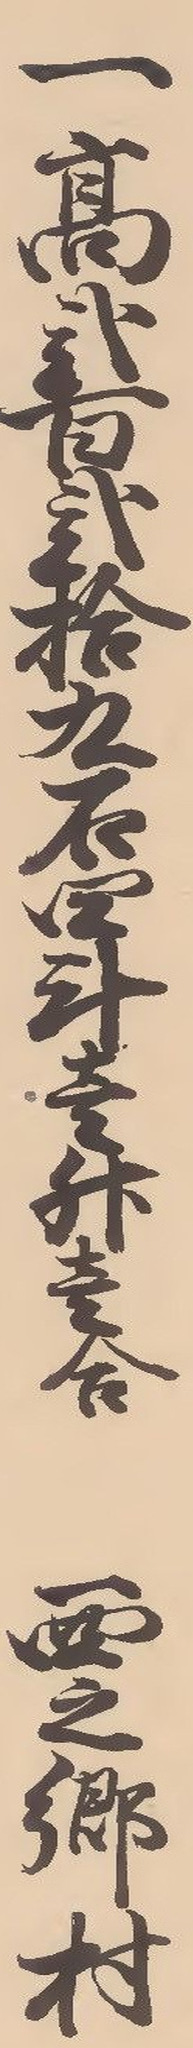一高弐百弐拾九石四斗壱升壱合西之郷村
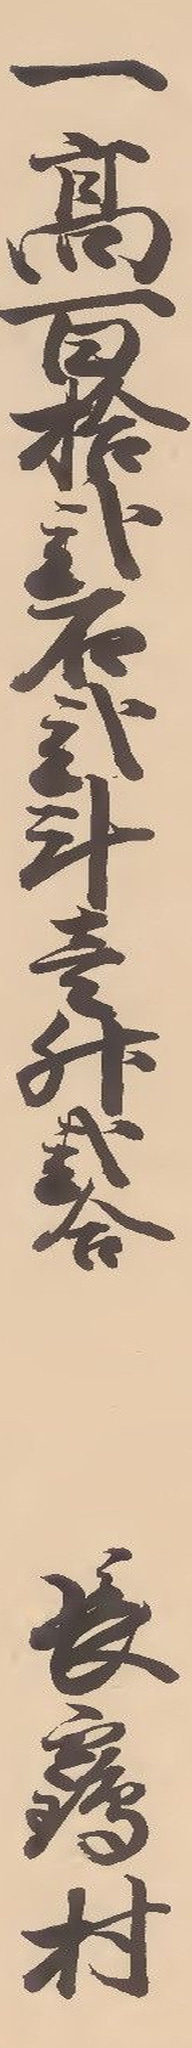一高百拾弐石弐斗壱升弐合長鶴村
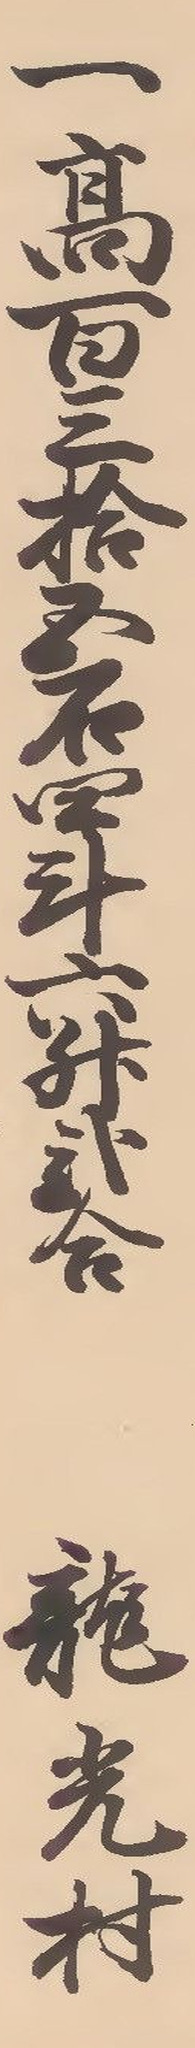一高百三拾五石四斗六升弐合龍光村

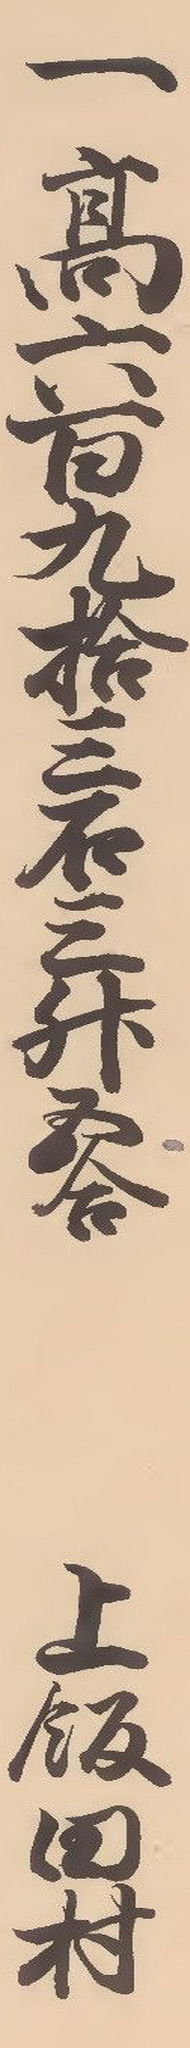一高六百九拾三石三升五合上飯田村
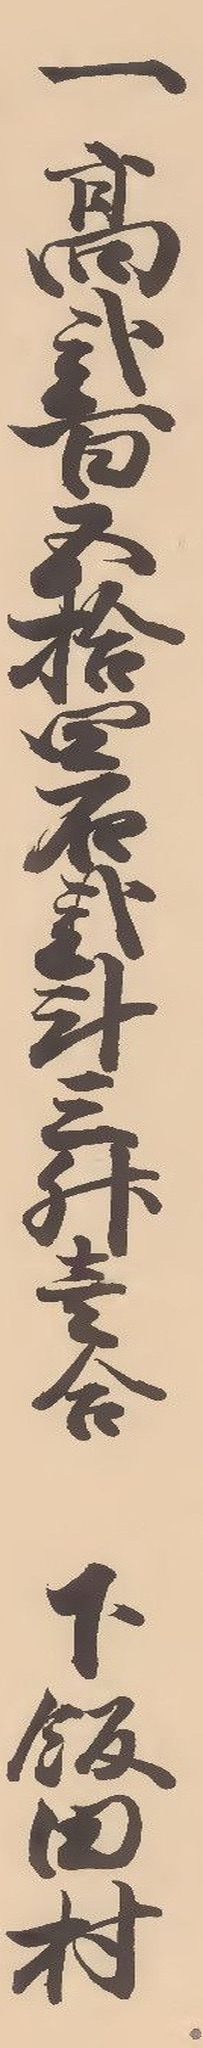一高弐百五拾四石弐斗三升壱合下飯田村
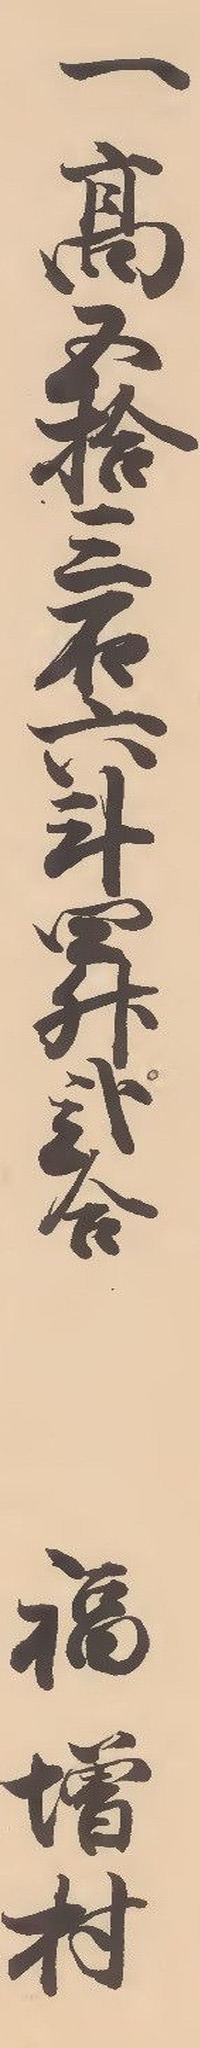一高五拾三石六斗四升弐合福増村
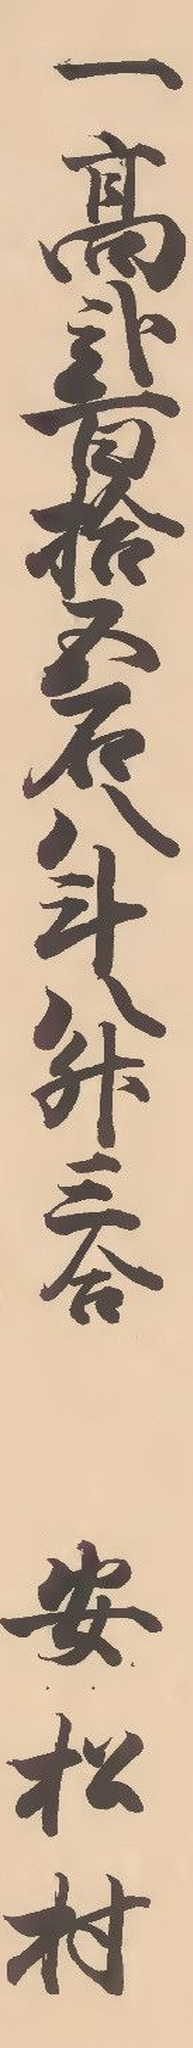一高弐百拾五石八斗八升三合安松村
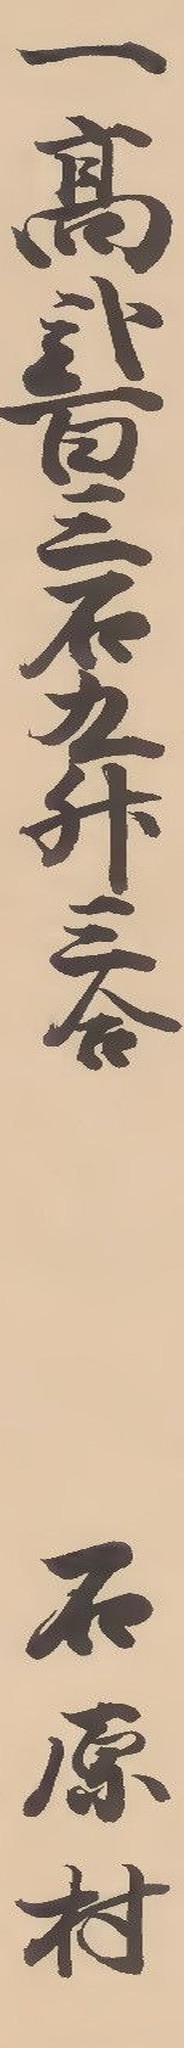一高弐百三石九升三合石原村
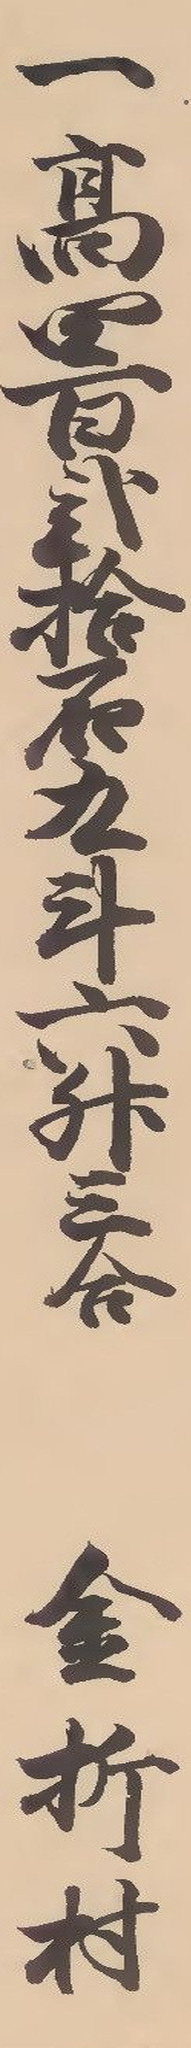一高四百弐拾石九斗六升三合金折村
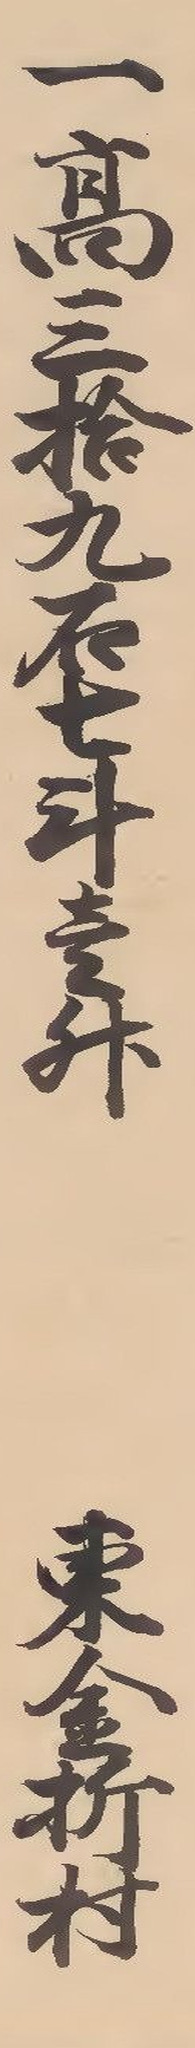一高三拾九石七斗壱升東金折村
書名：遠江国郷帳
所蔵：国立公文書館 National Archives of Japan
